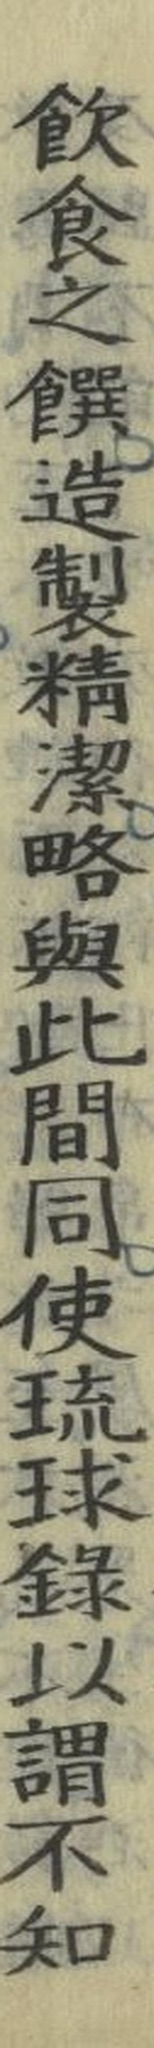飮食之饌。造製精潔。略與此間同。使琉球錄以謂不知
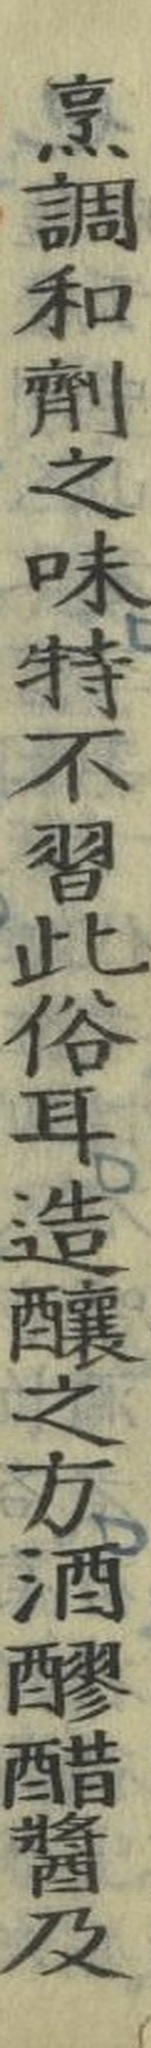烹調和劑之味。特不習此俗耳。造釀之方。酒醪醋醬
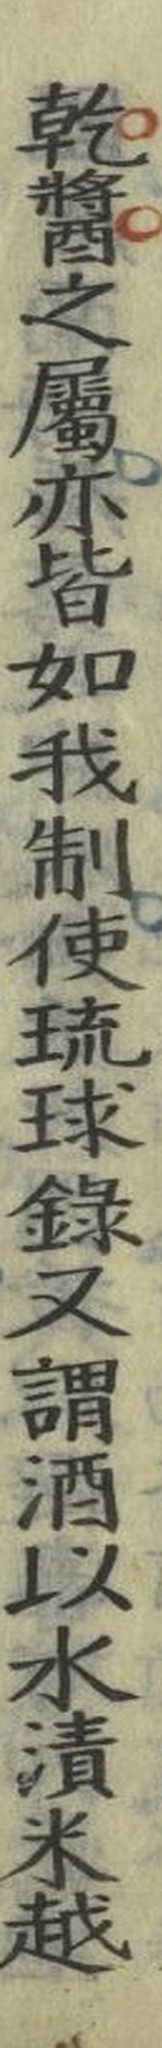乾醬之屬。亦皆如我制。使琉球錄又謂酒以水漬米越
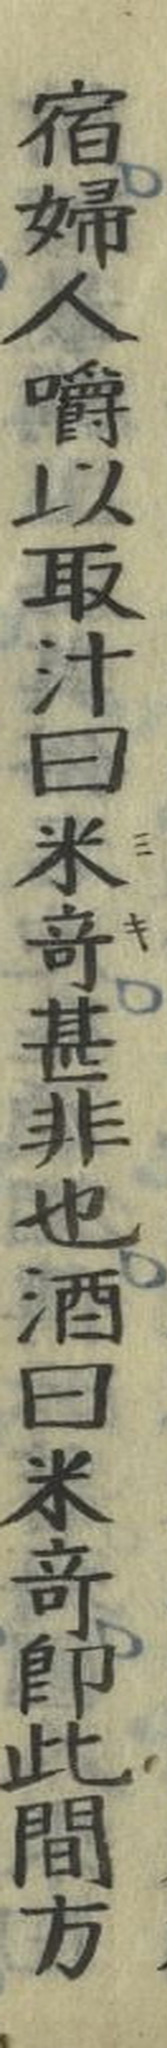宿。婦人嚼以取汁曰米竒。甚非也。酒曰米竒。卽此間方
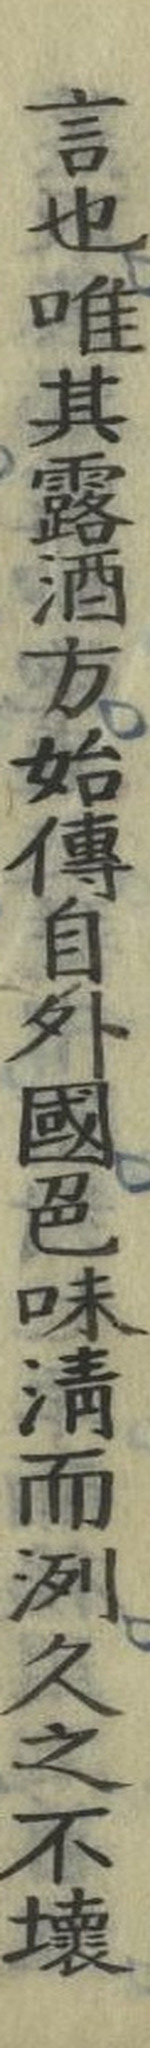言也。唯其露酒方。始傳自外國。色味淸而洌。久之不壞。
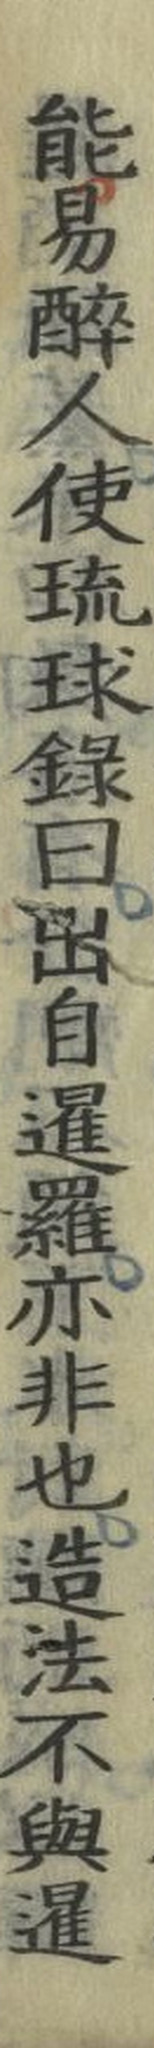能易醉人。使琉球錄曰。出自暹羅。亦非也。造法不與暹

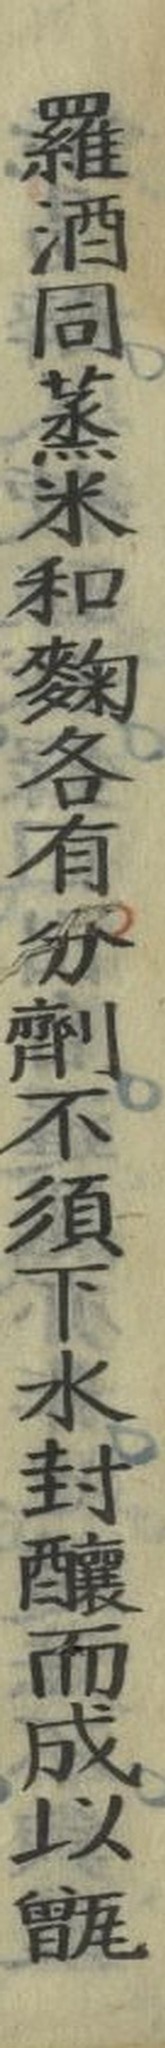羅酒同。蒸米和麴。各有分劑。不須下水。封釀而成。以甑
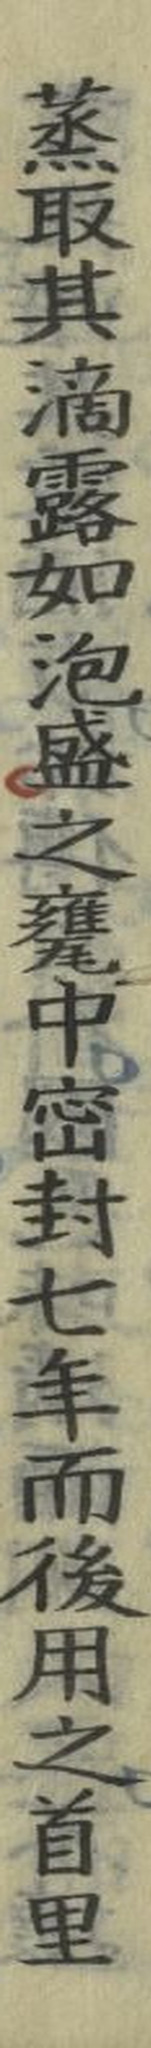蒸取其滴露如泡。盛之甕中。密封七年而後用之。首
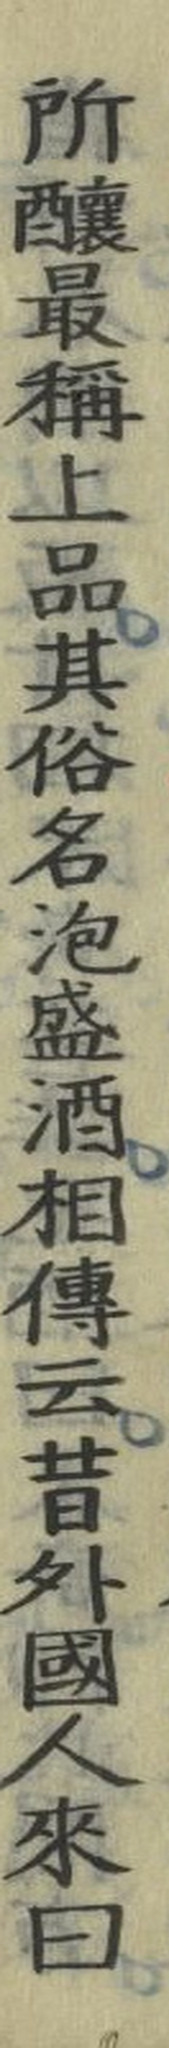所釀最稱上品。其俗名泡盛酒。相傳云。昔外國人來曰。
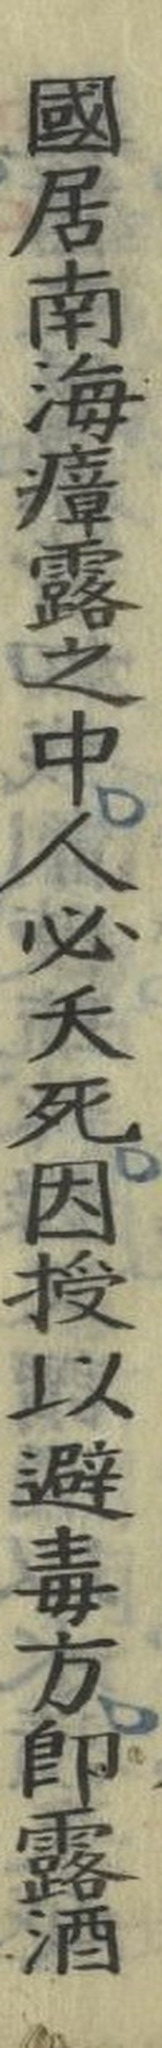國居南海瘴露之中。人必夭死。因授以避毒方。卽露酒
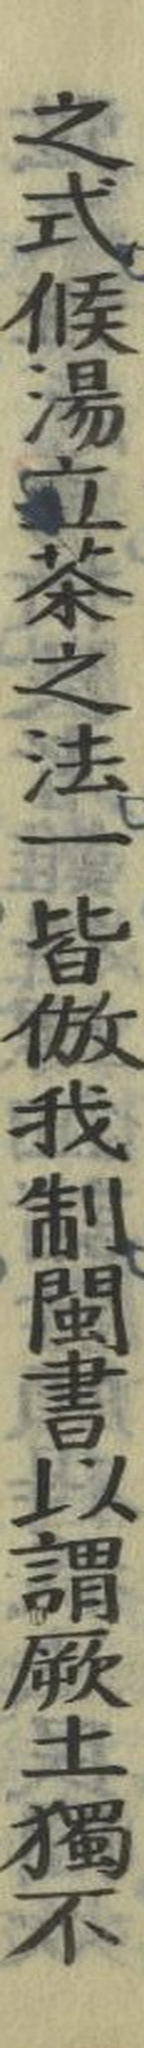之式。候湯立茶之法。一皆倣我制。閩書以謂厥土獨不
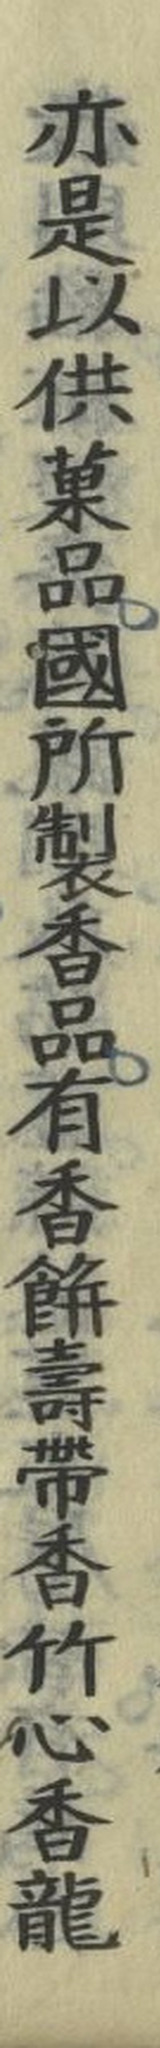亦是以供菓品。國所製香品。有香餅壽帶香竹心香龍
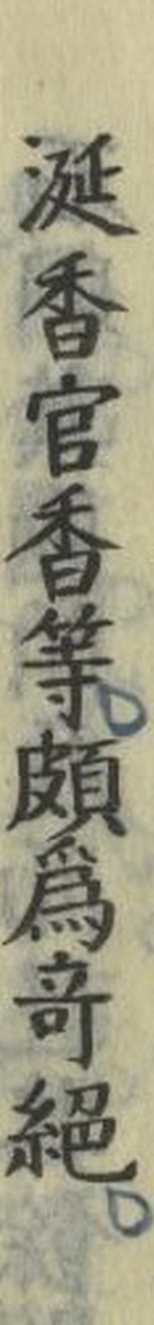涎香官香等。頗爲竒絕。
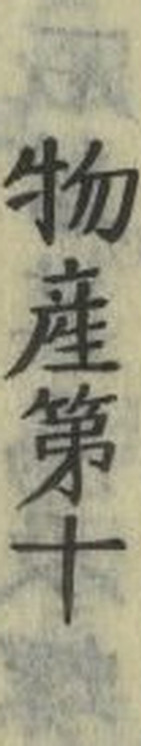物産第十
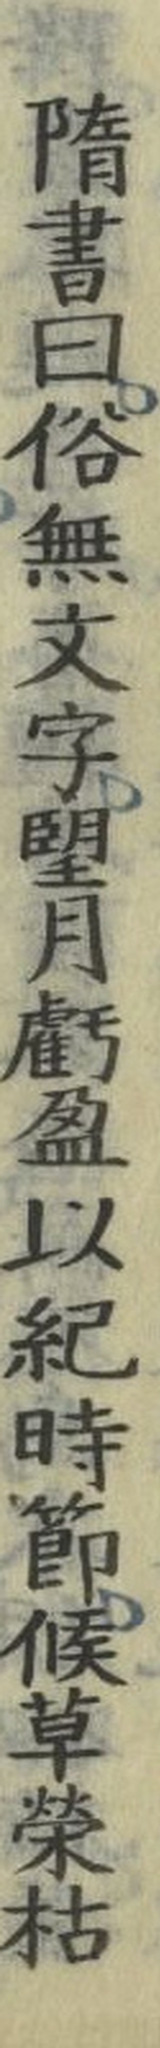隋書曰。俗無文字。朢月虧盈以紀時節。候草榮枯
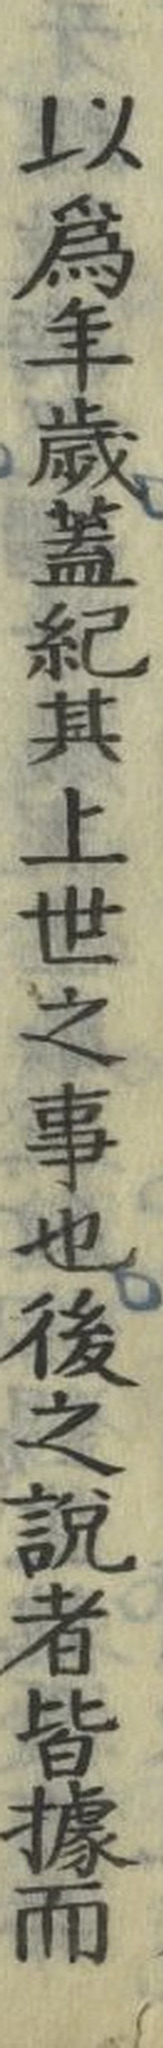以爲年歲。蓋紀其上世之事也。後之說者皆據而
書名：南島志
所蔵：University of the Ryukyus Library
